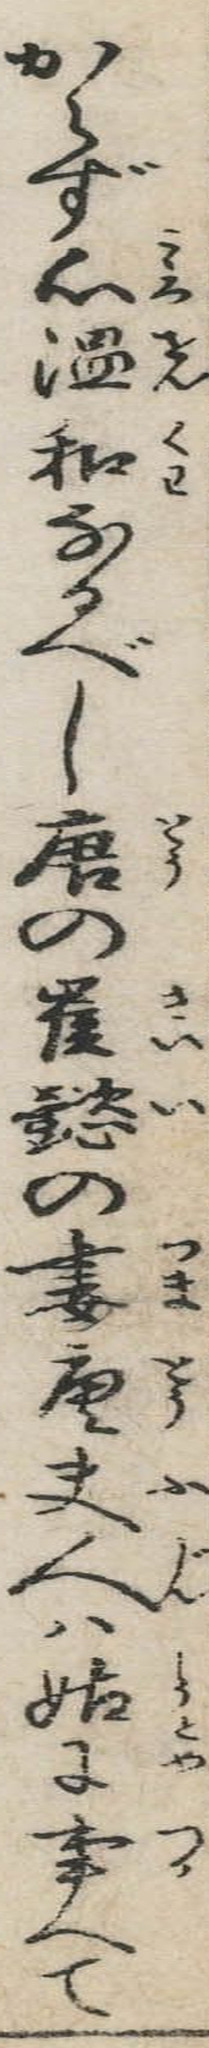からず心温和なるべし唐の崔懿の妻唐夫人は姑に事へて
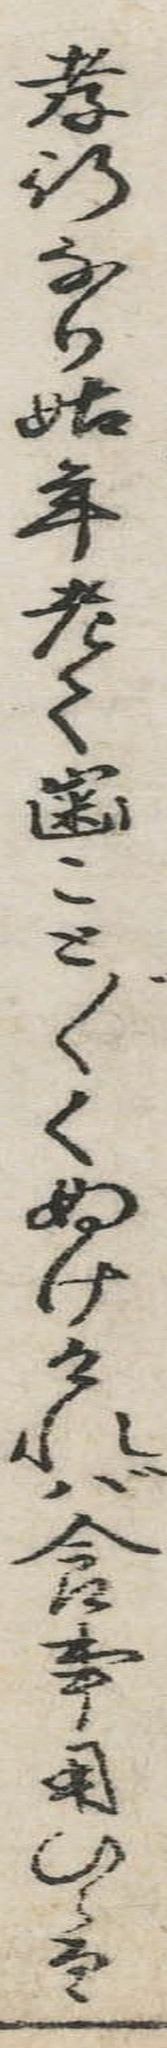孝行なり姑年老て歯こと〴〵くぬけければ食事用ひらるゝ
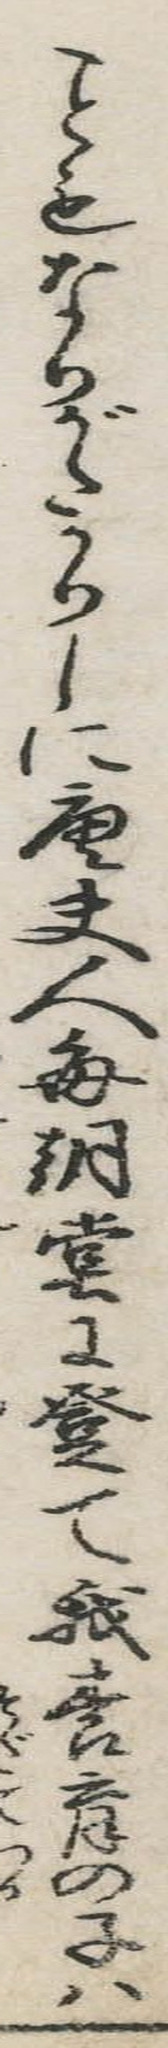ことなりがたかりしに唐夫人毎朝堂に登て我養育の子は
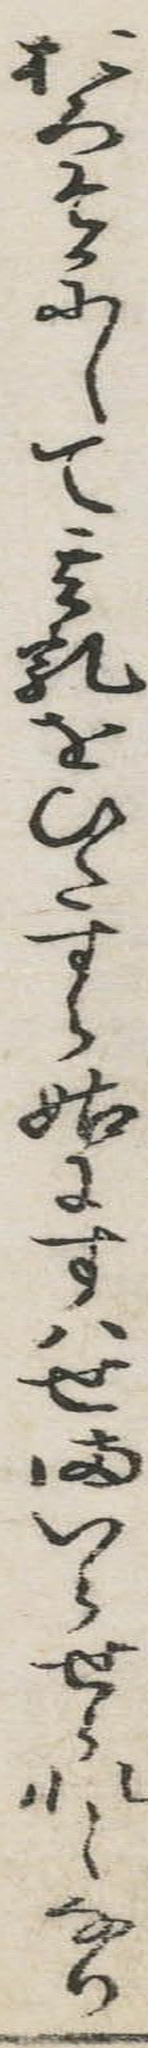おろそかににして其乳をひたすら姑にすはせまいらせられしなり
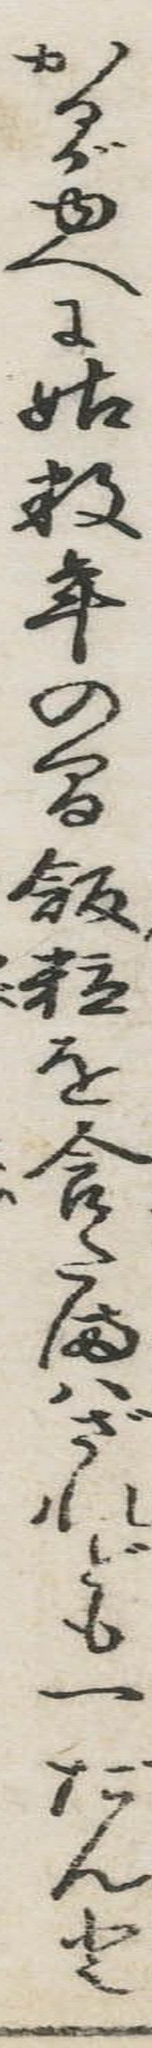かるがゆへに姑数年の間飯粒を食たまはざれども一だんと
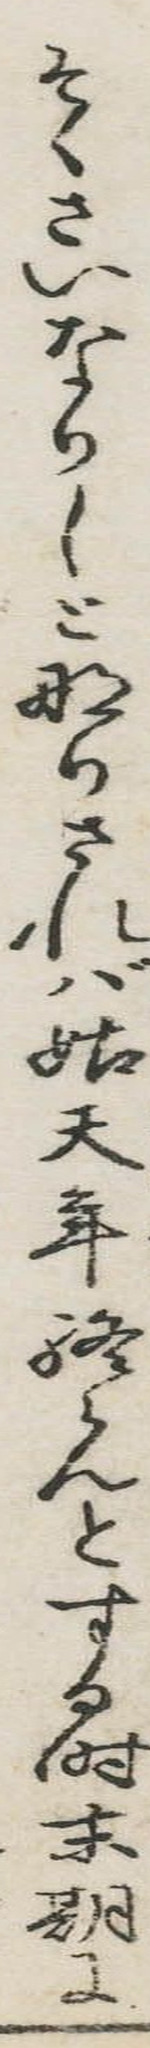そくさいなりしとなりされば姑天年終らんとする時末期に
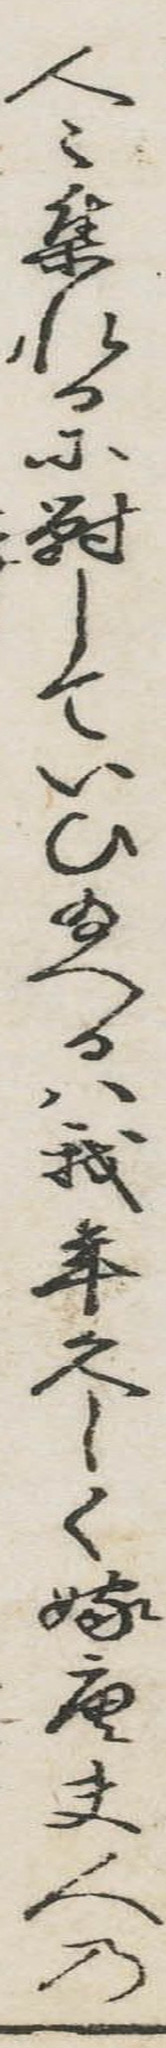人々集れるに対していひ給へるは我年久しく嫁唐夫人の
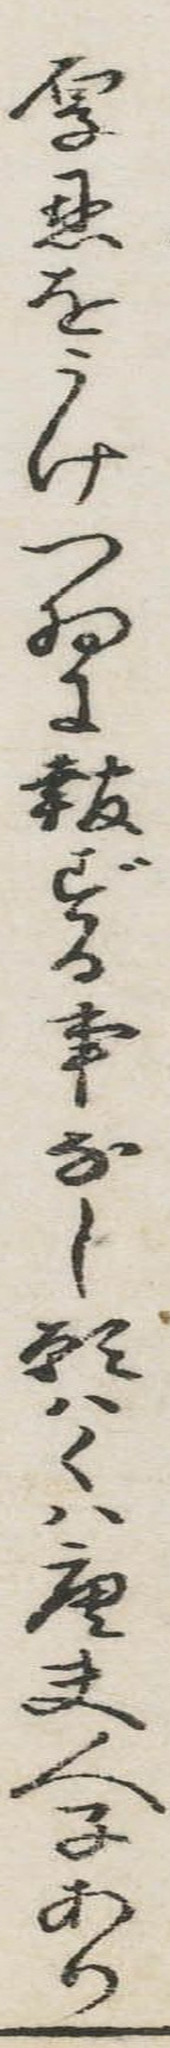厚恩をうけつゐに報ずる事なし願はくは唐夫人子あり
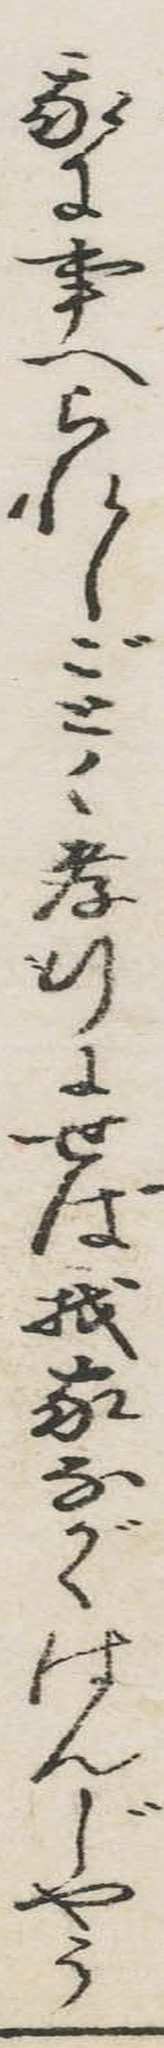我に事へられしごとく孝行にせば我家ながくはんじやう
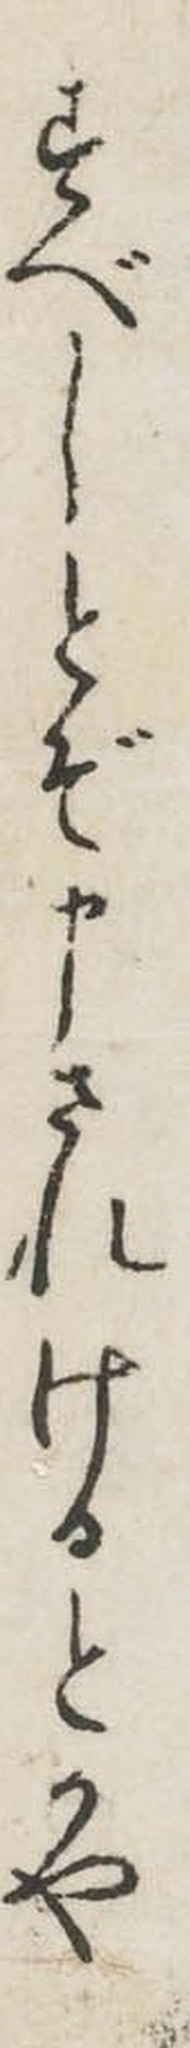すべしとぞ申されけるとかや
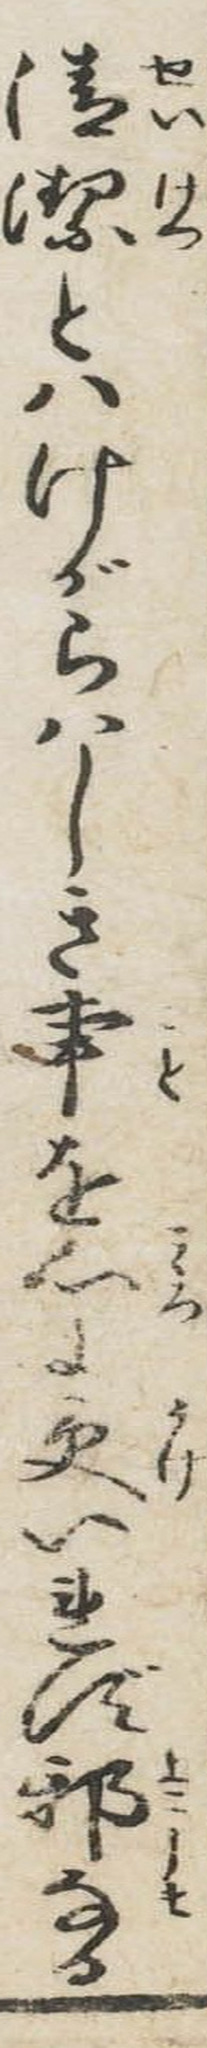清潔清潔とはけがらはしき事を心に受いれず邪なる
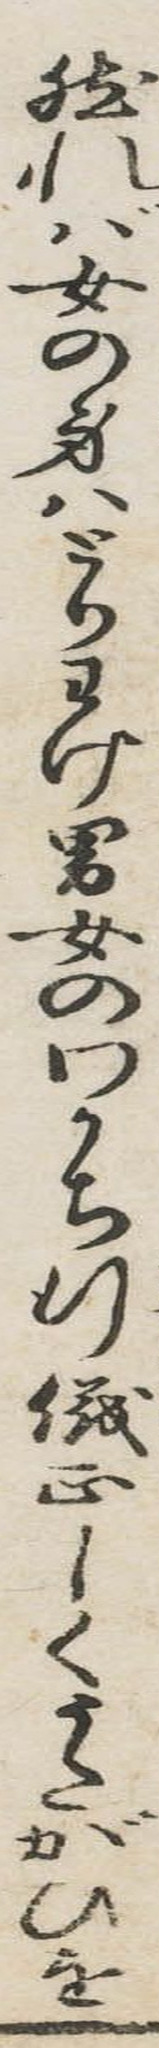然れば女の身はとりわけ男女のわかち行儀正しくうたがひを
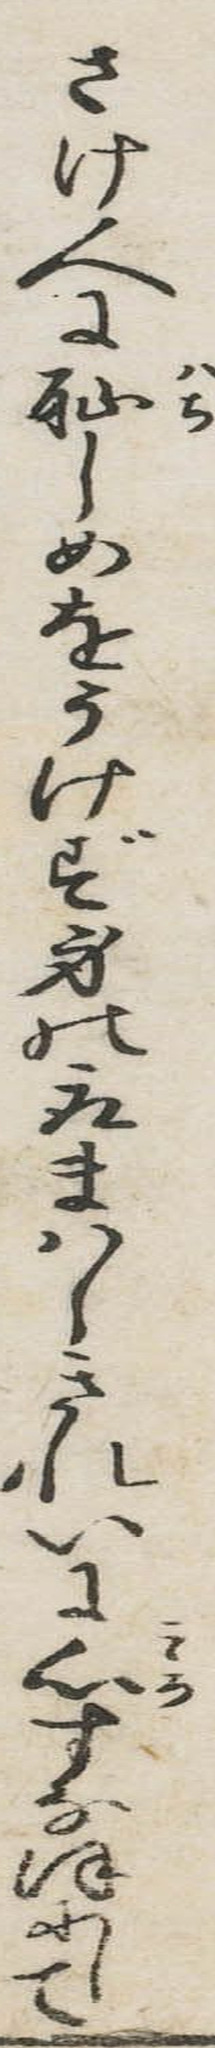さけ人に恥しめをうけず身の取まはしきれいに心すなほにて
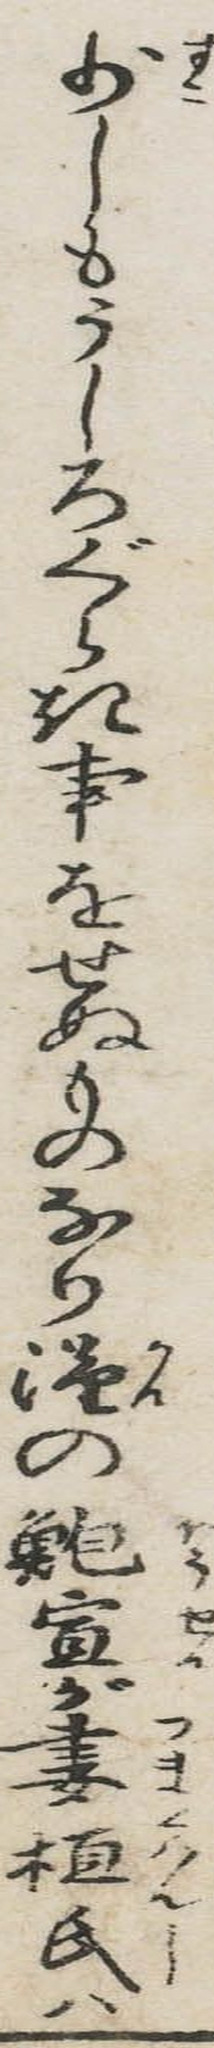少しもうしろぐらき事をせぬものなり漢の鮑宣が妻桓氏は
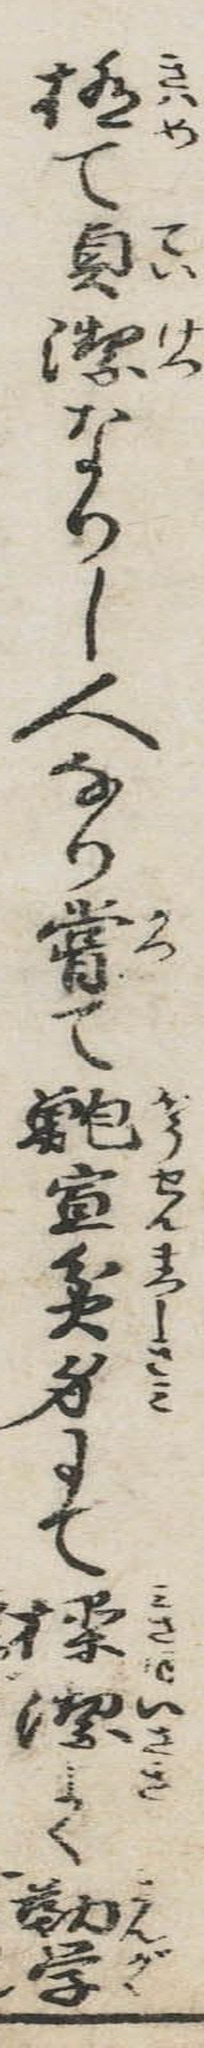極て貞潔なりし人なり嘗て鮑宣貧身にて操潔よく勤学
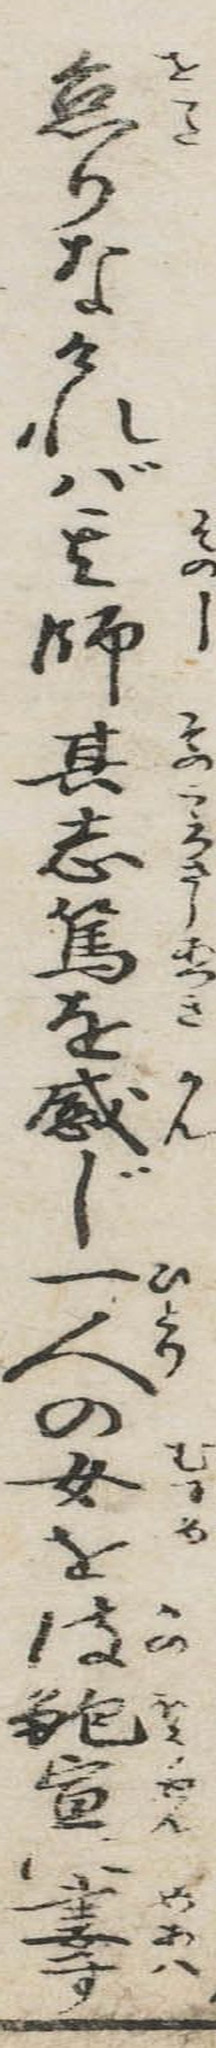怠りなければ其師其志篤を感じ一人の女を彼鮑宣に妻す
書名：前訓
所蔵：東京学芸大学附属図書館
